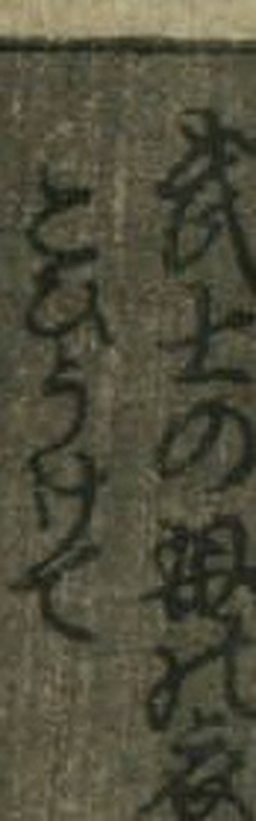こひうけて
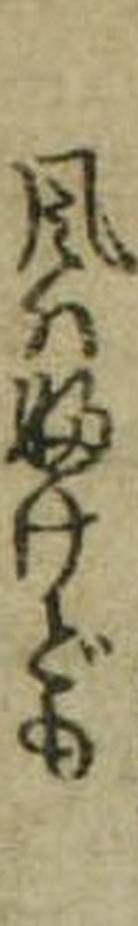風はふけども
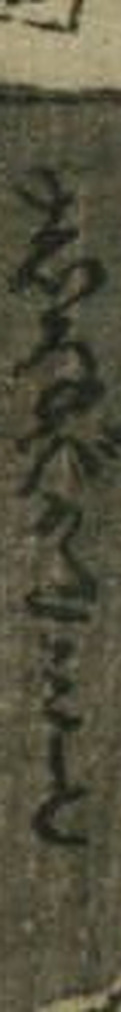しなばかたみと
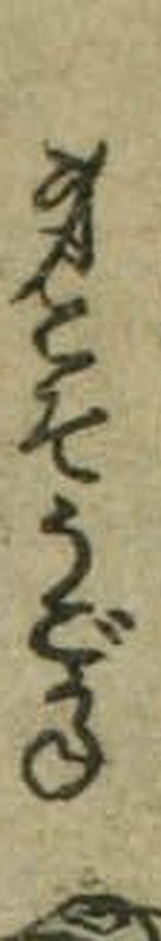身とそうごかね
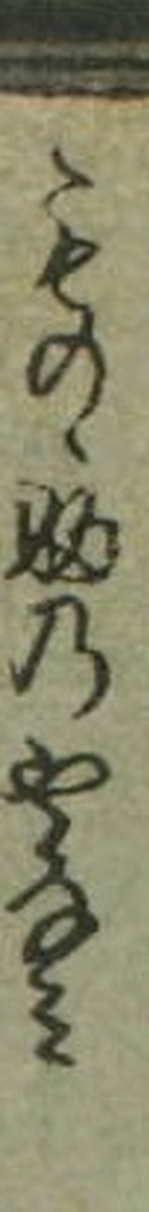ものゝふのやなみ
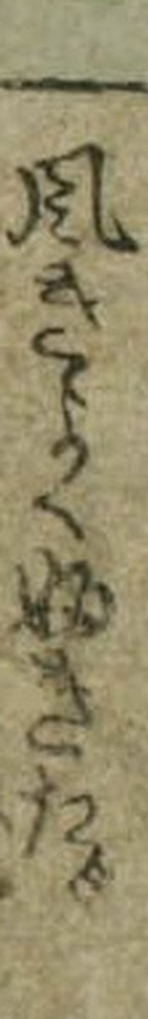風きよくふきたち
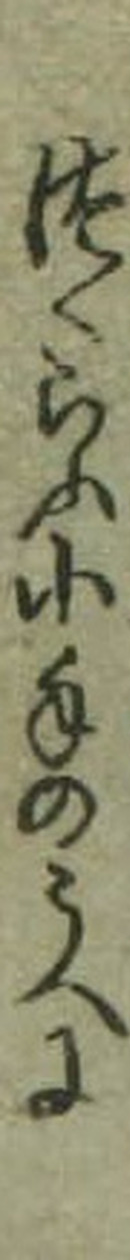つくらふ小手のうへに
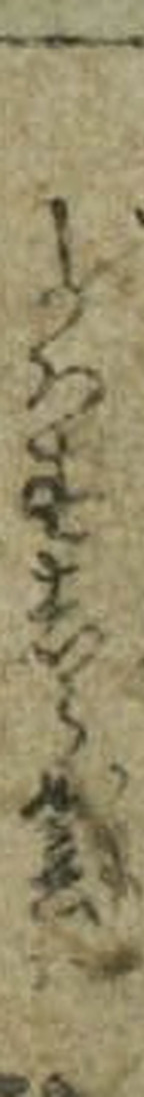まはすしら雲は
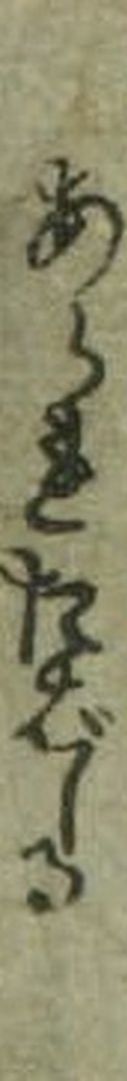あられたばしる
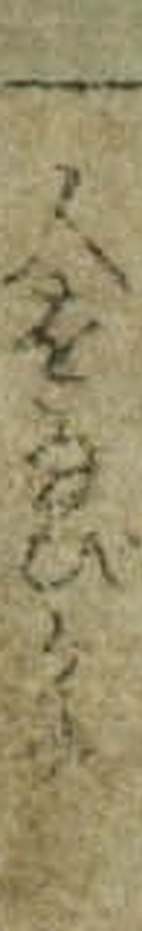人をなびかふ
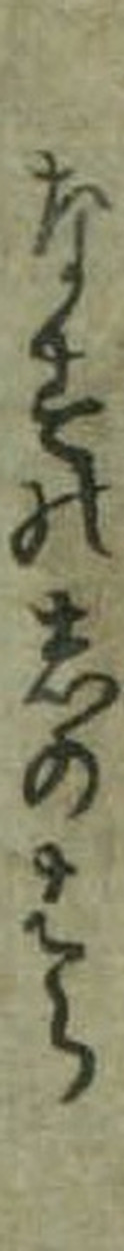なすのしのはら
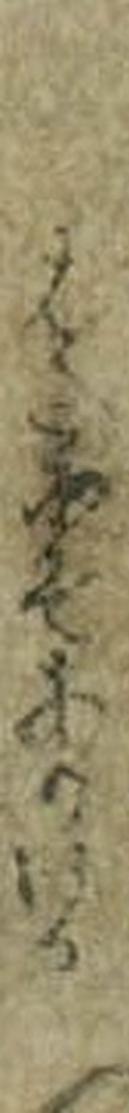はたにぞありける
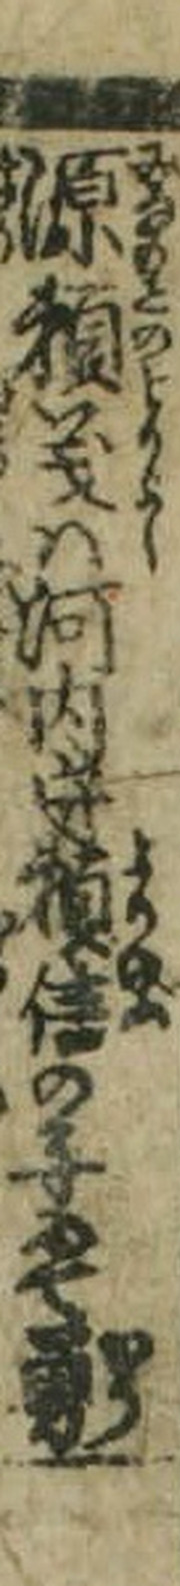源頼義は河内守頼信の子にて勇
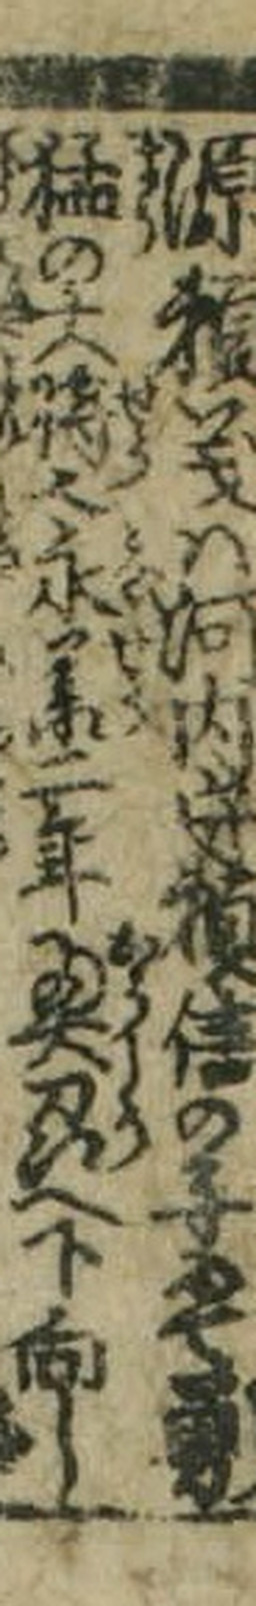猛の大将也永承二年奥州へ下向し
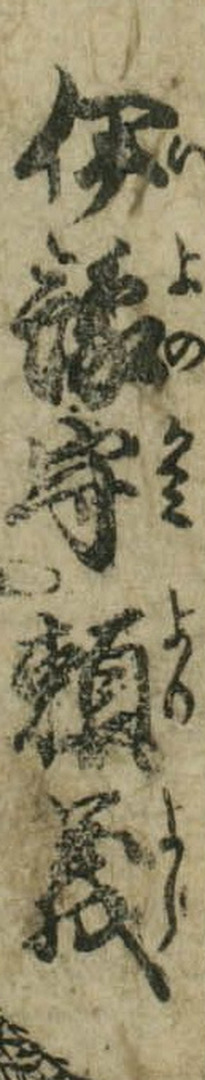伊豫守頼義
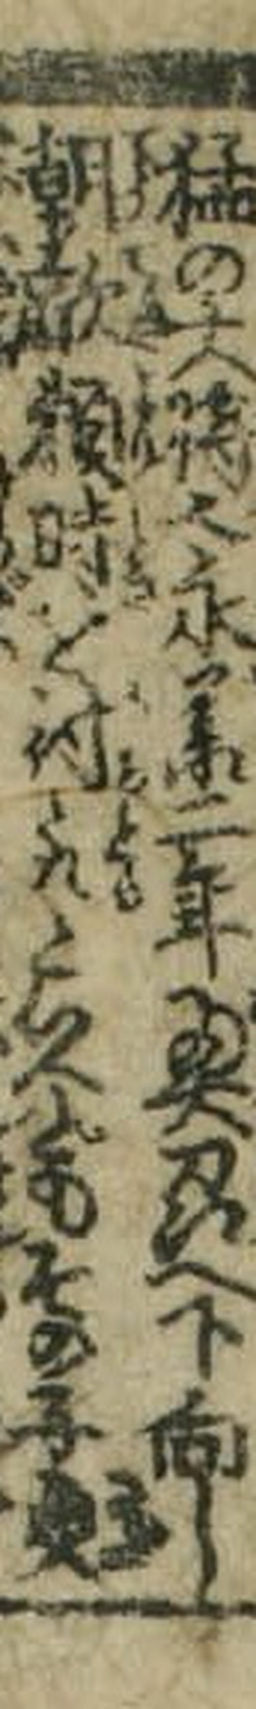朝敵頼時を討取といへどもその子貞
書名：續英雄百人一首
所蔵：東京学芸大学附属図書館
